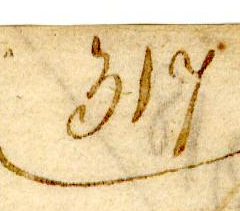317
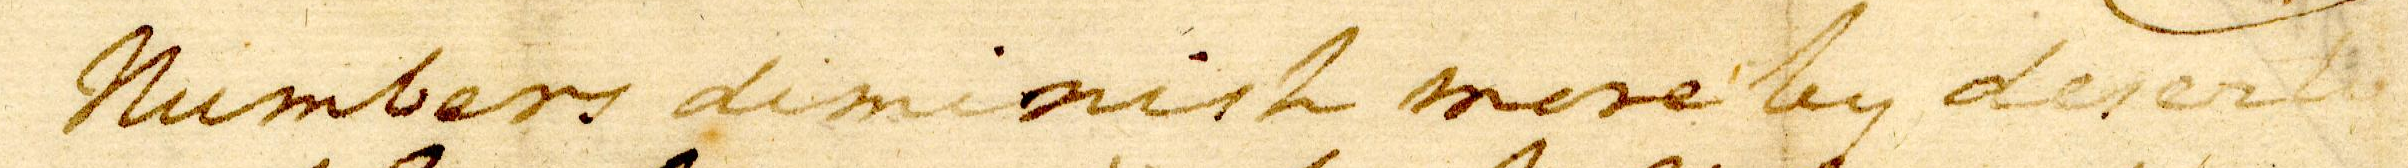Numbers diminish mere by desert
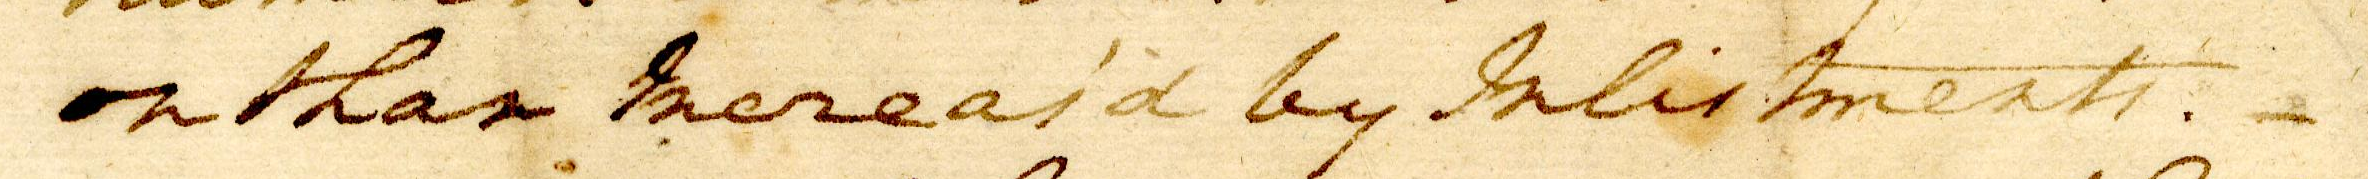on than increas'd by Inlistments.-
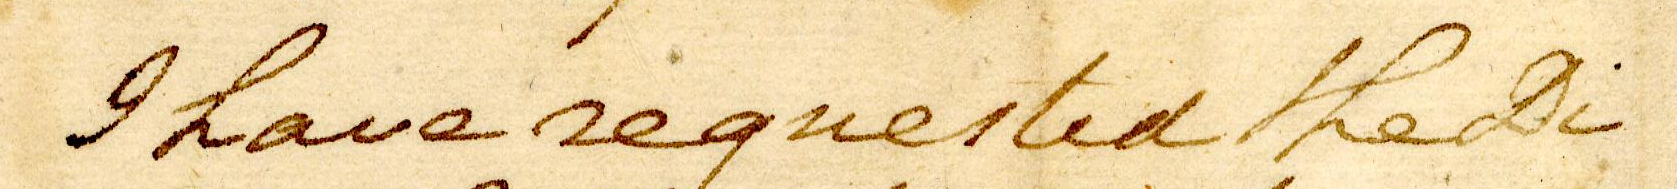I have requested the Di
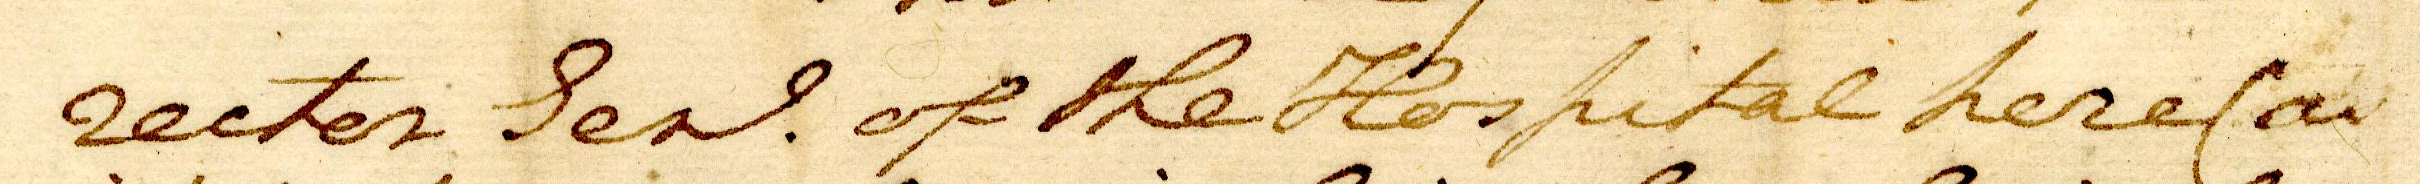recter Gen^l. of the Hospital here (as
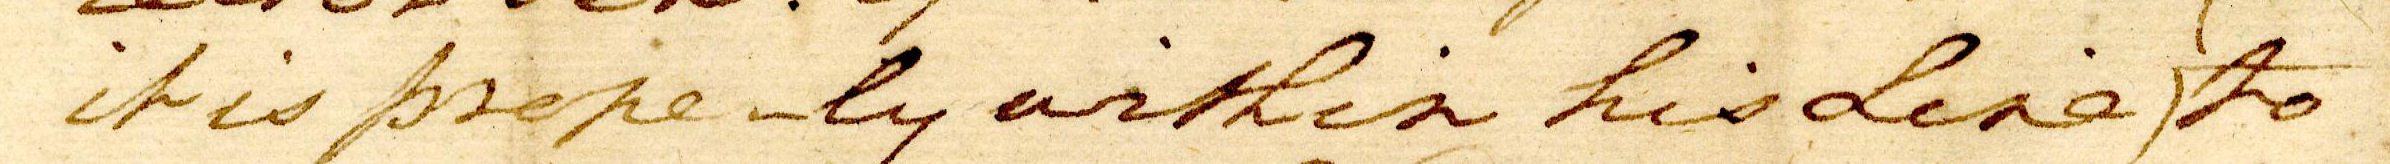it is properly within his hand to
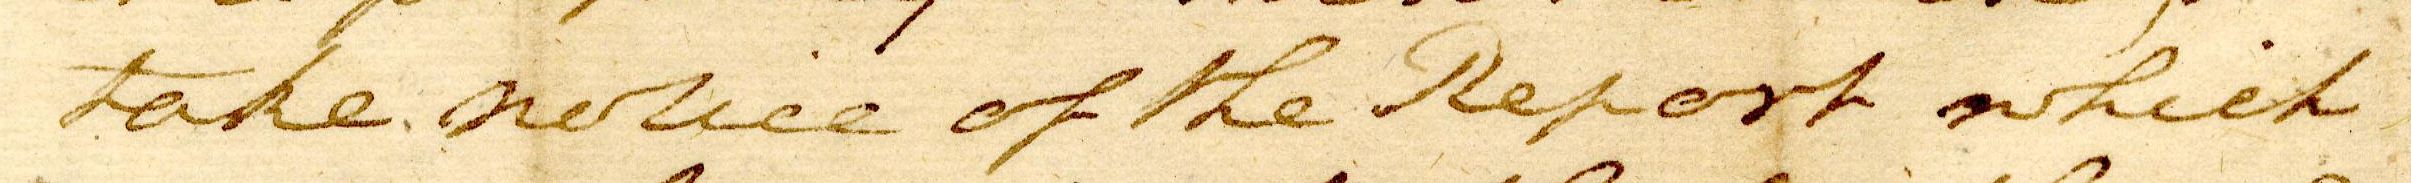take notice of the Report which
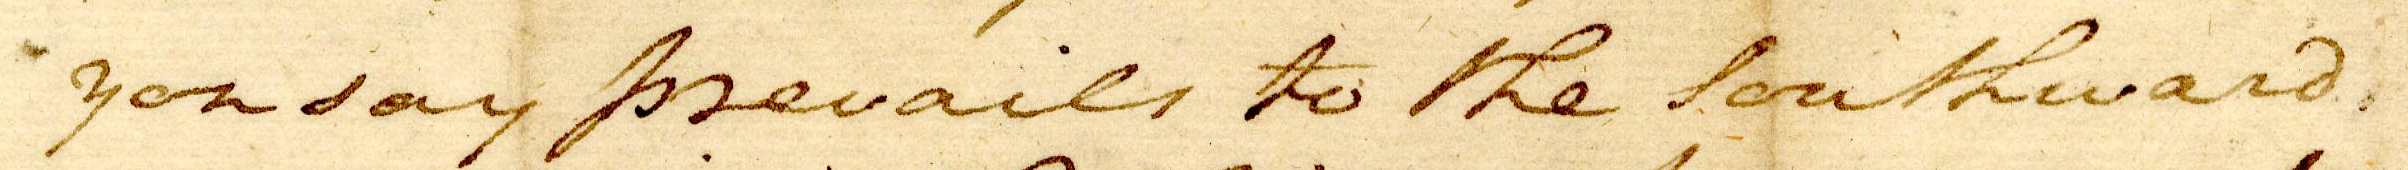you say prevails to the southward
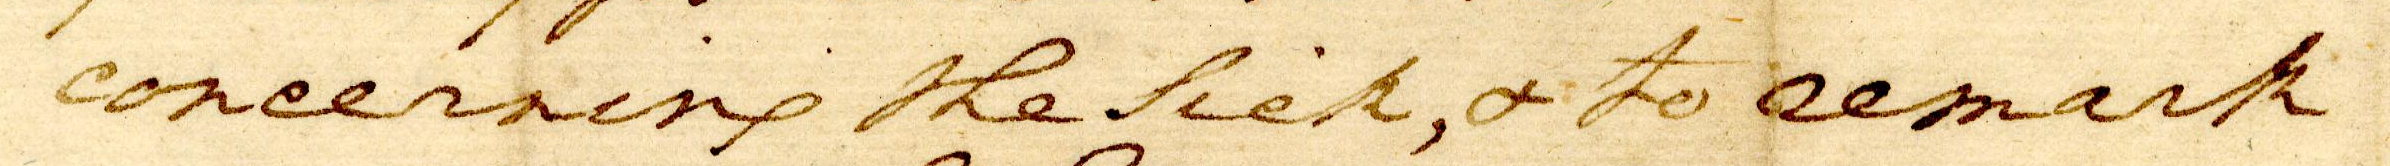concerning the sick, & to remark
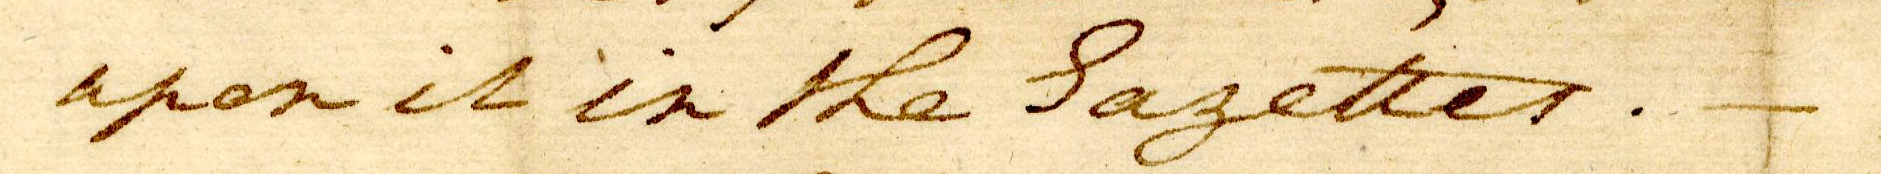upon it in the Gazettes.-
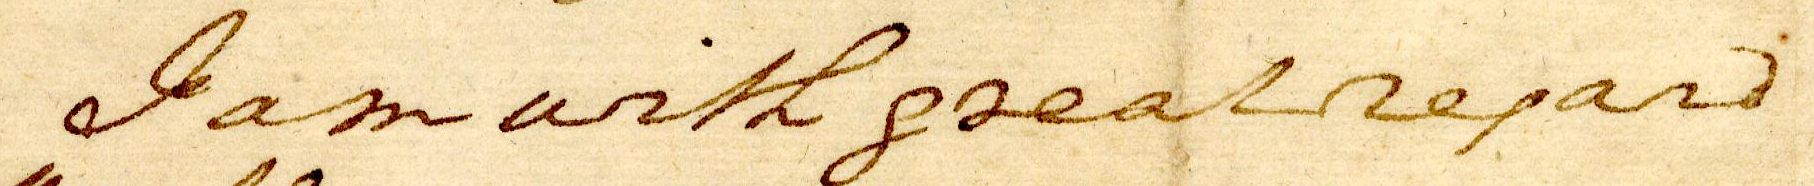I am with great regard
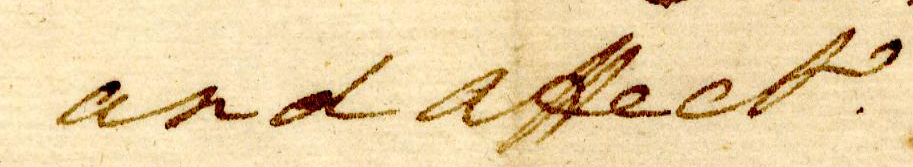and affect.
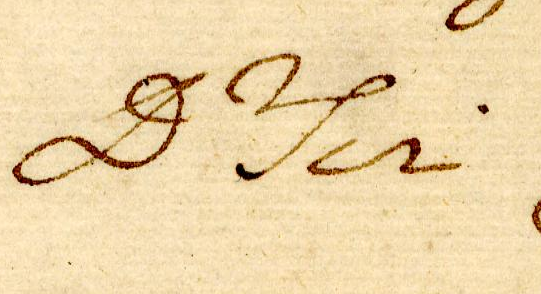D Sir
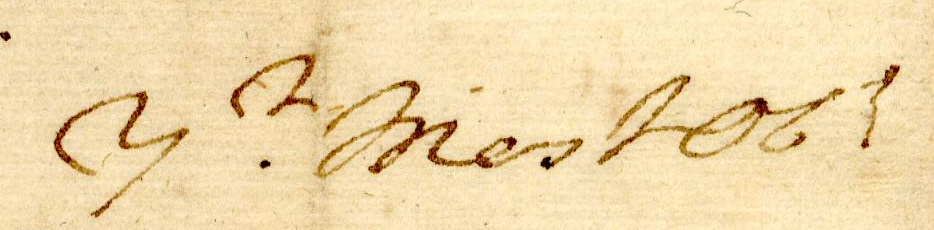Y^r most ob^t
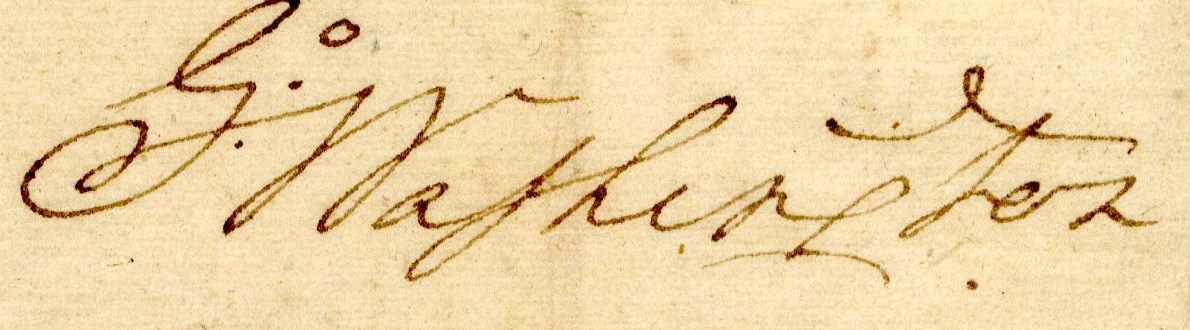G^o: Washington
